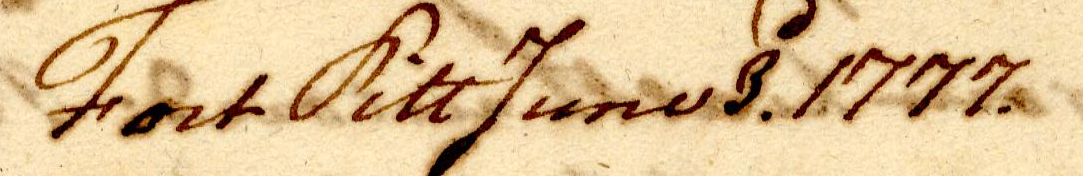Fort Pitt June 3^d. 1777.
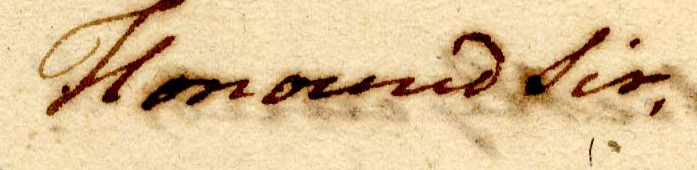Honoured Sir,
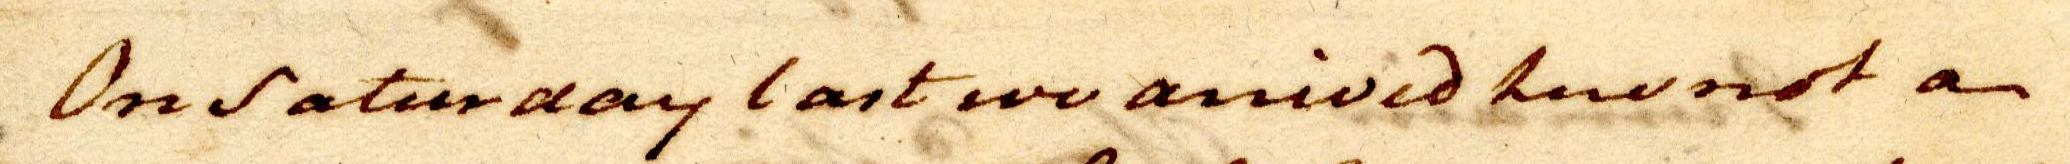On Saturday last we arrived here not a
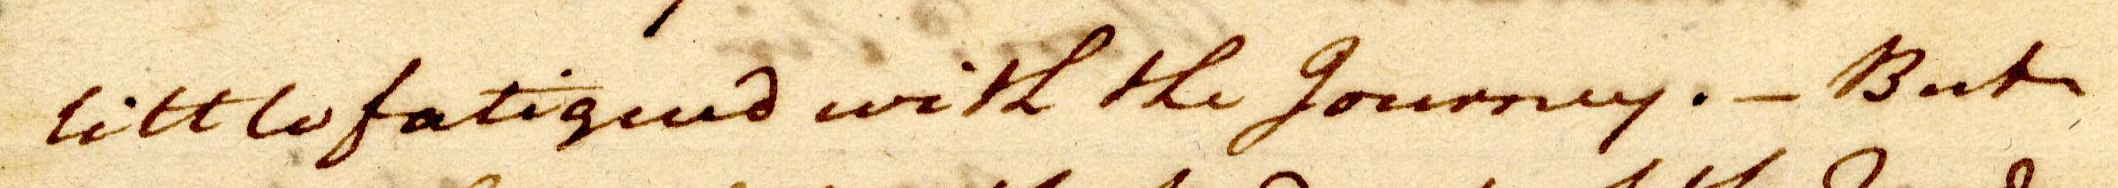little fatigued with the Journey.- But
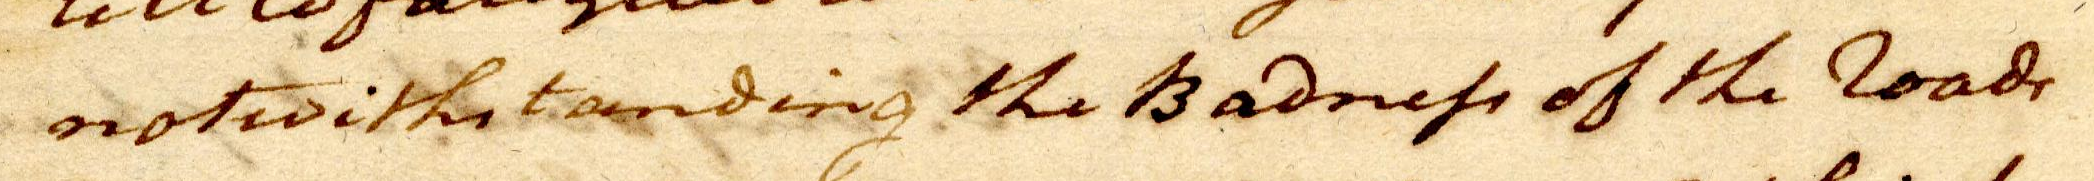notwithstanding the Badness of the roads
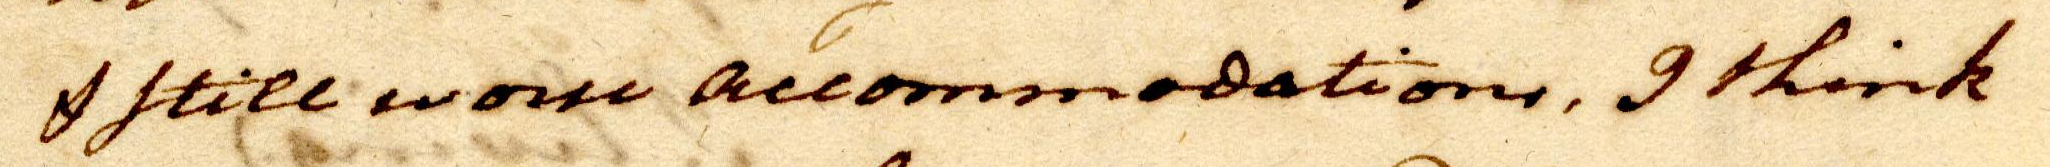& still worse accommodations, I think
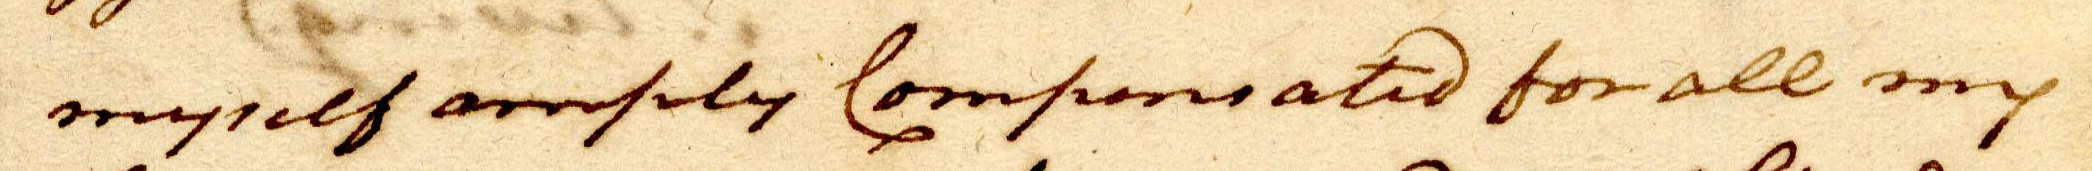myself amply Compensated for all my
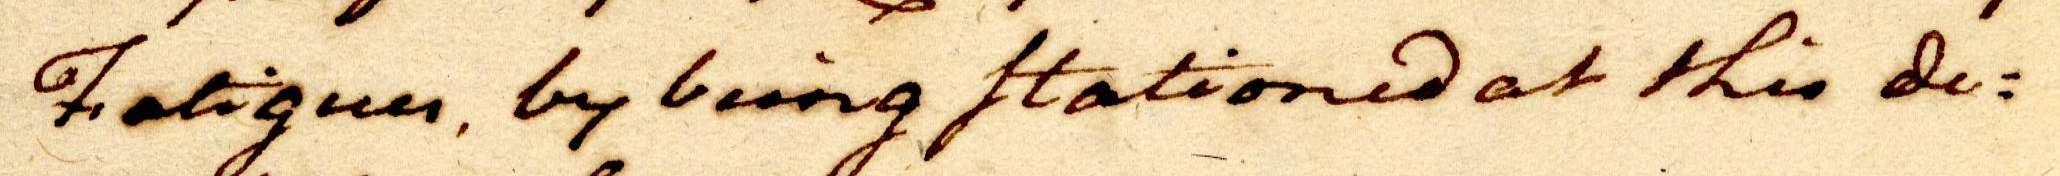Fatigues, by being stationed at this de-
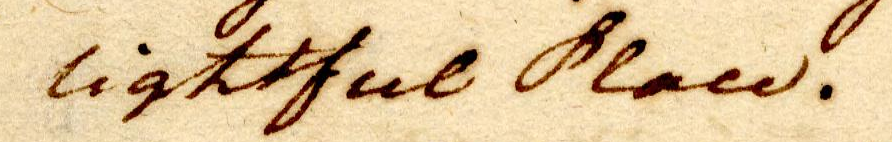lightful Place.
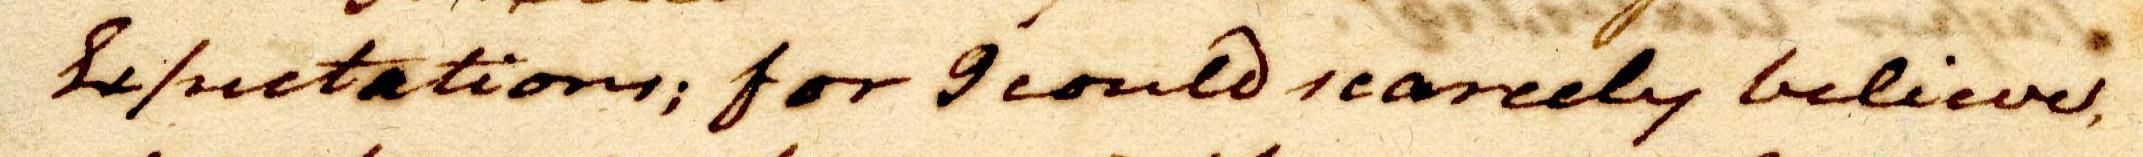Expectations; for I could scarcely believe,
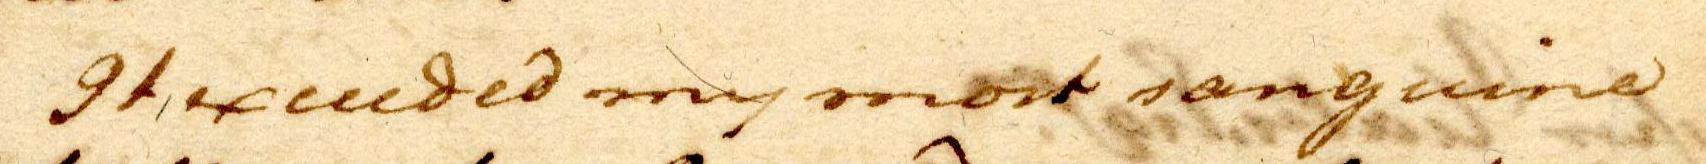It exceeded my most sanguine
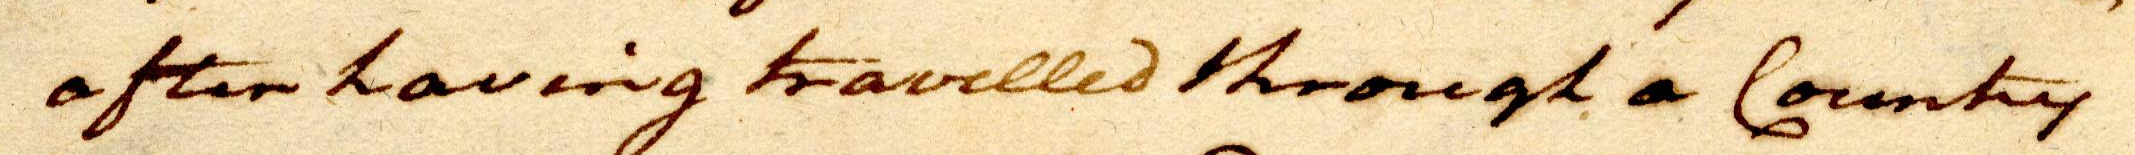aften having travelled through a Country
